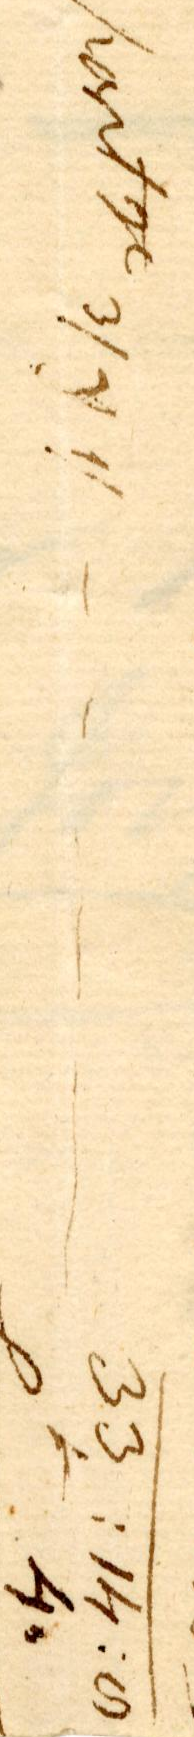Hant^gl 3/g.- 33 : 14:01
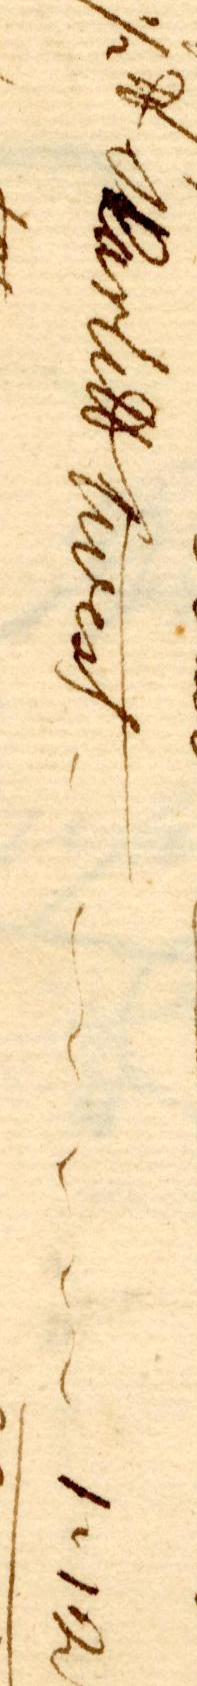1/2 Sparlett invest-- 1-12
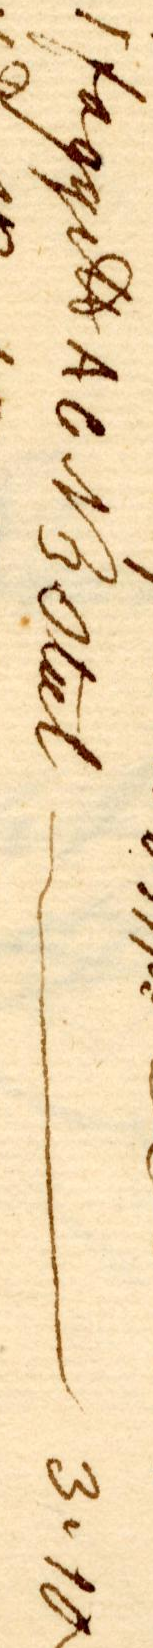Haggert AC Total.- 3.10
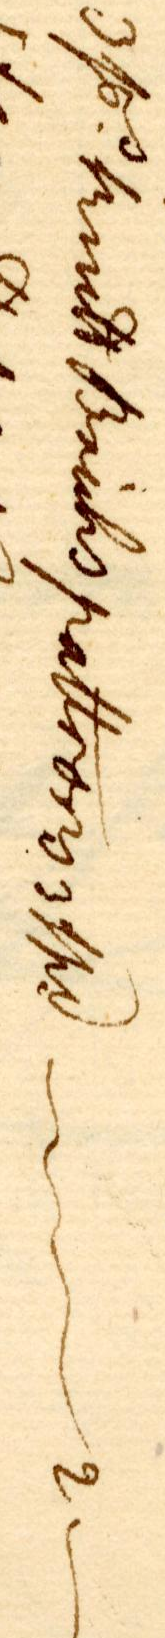3 p^r Knitt Bricks patrons 3 shd.- 2.-
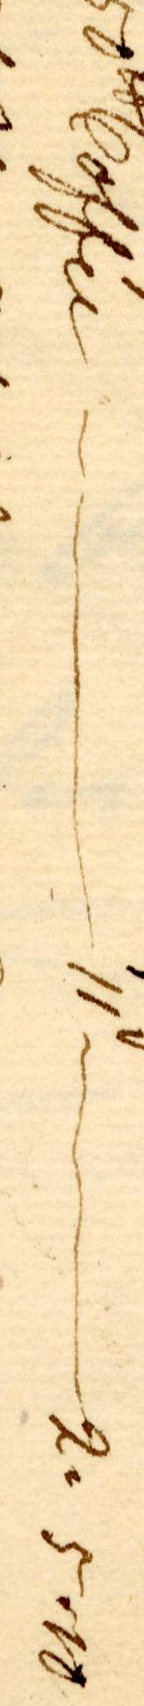50^g Coffee.-11.- 20 5 .10
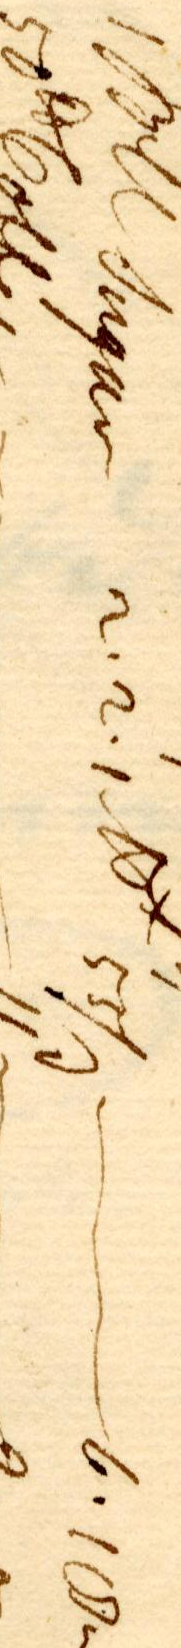1 Bll Sugar 2.2.1 [_]^t 55s .- 6.100
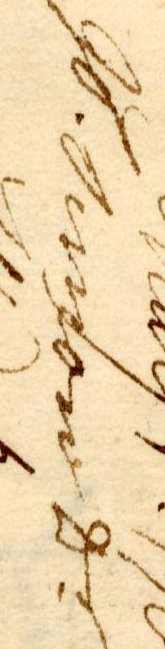Jo^s. Simon D^r.
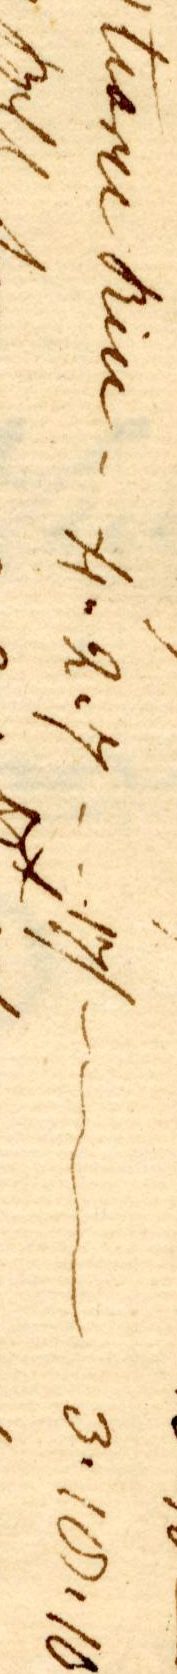1 Teame Bill- 4.2.7 - -- 17s - - 3. 100.10 10
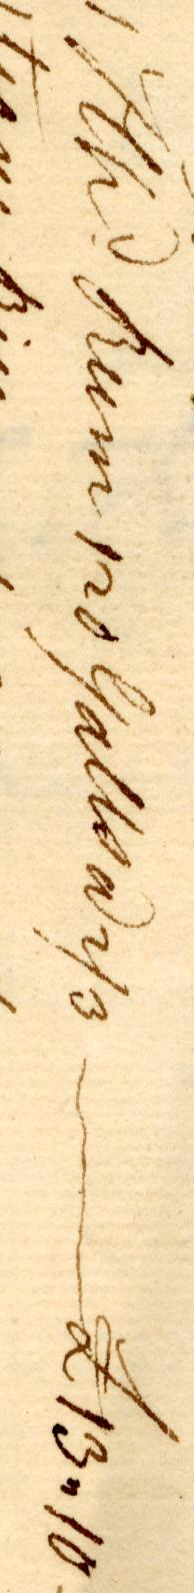1 Hh^d Rum 120 Gallons @ 2/3.- £13.10
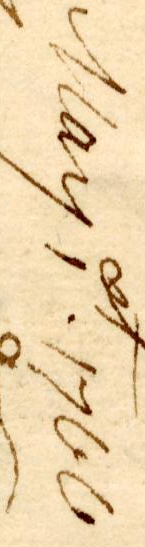May 1^st 1766
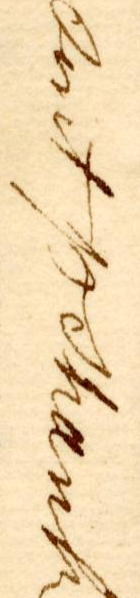Acco^t G Shank
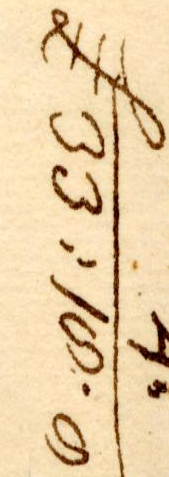£33:18'8
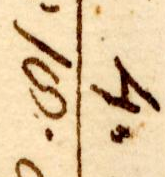4
